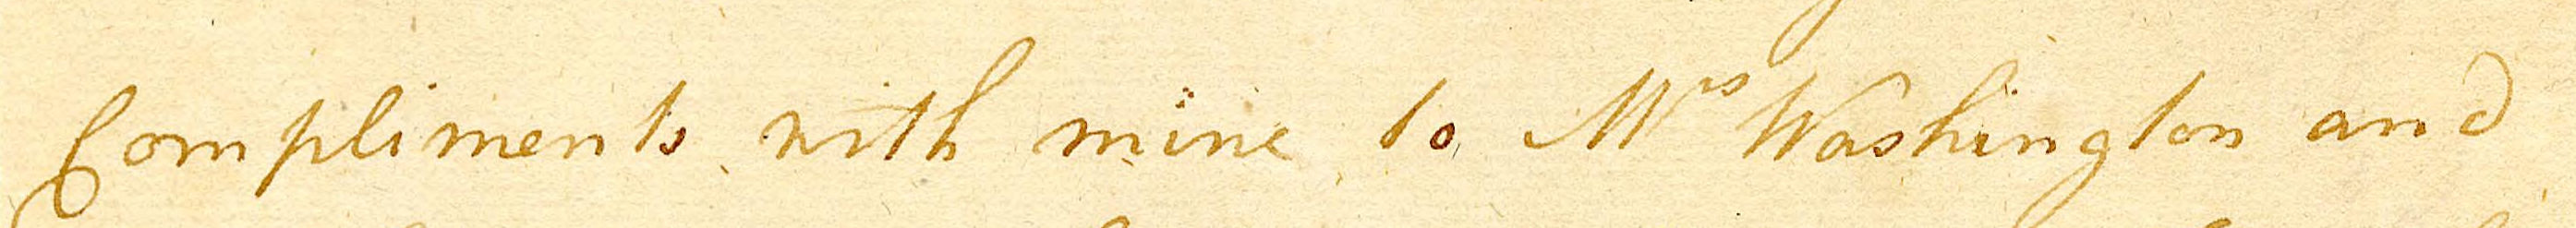Compliments with mine to M^rs Washington and
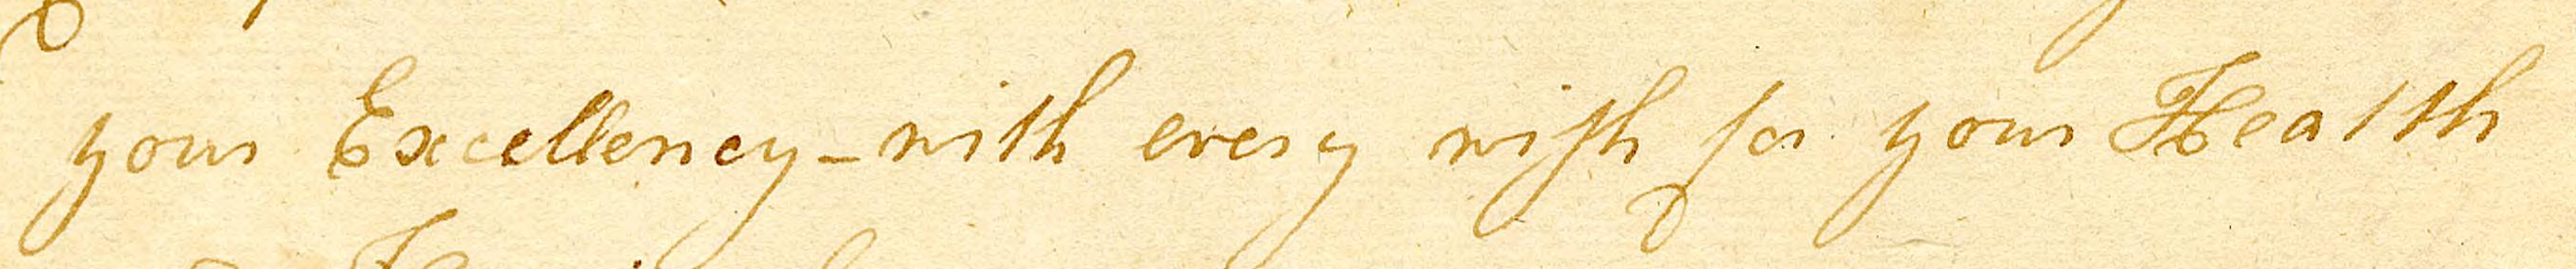your Excellency- with every wish for your Health
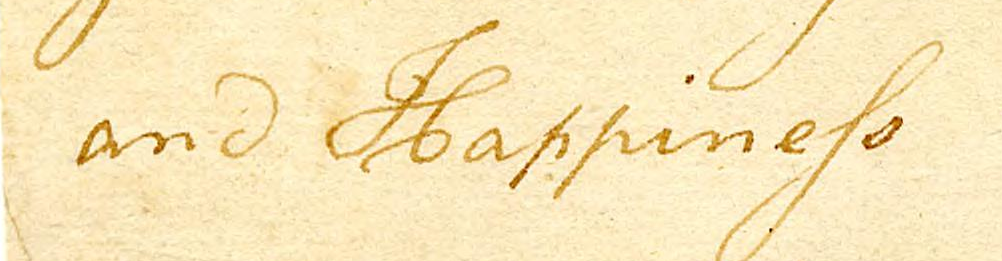and Happiness
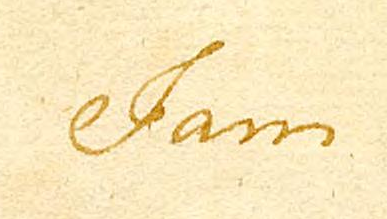I am
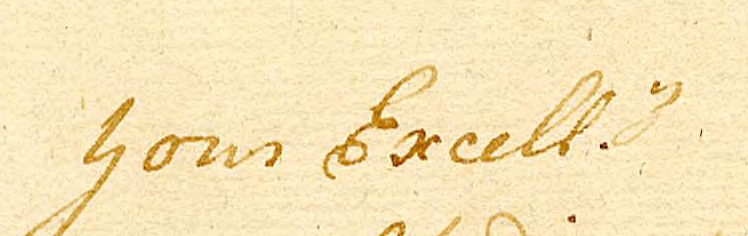Your Excell^y.
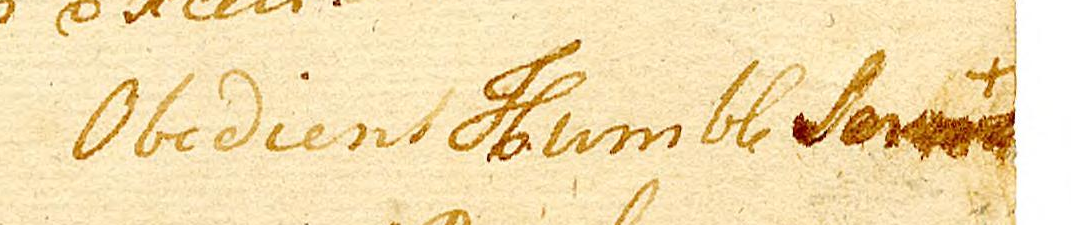Obedient Humble Serv^t
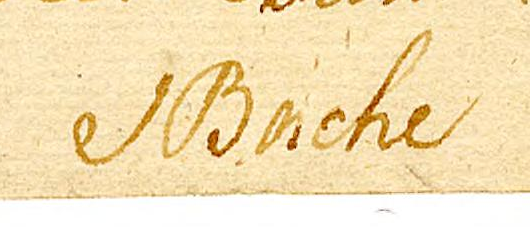S Bache
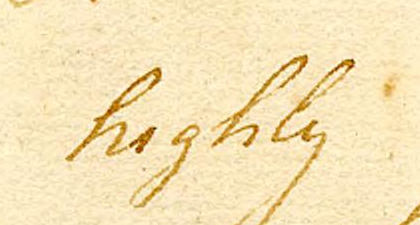highly
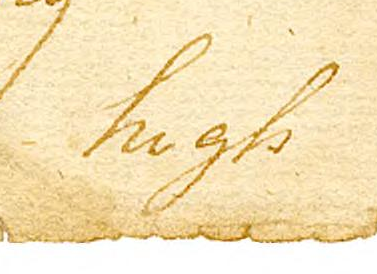high
